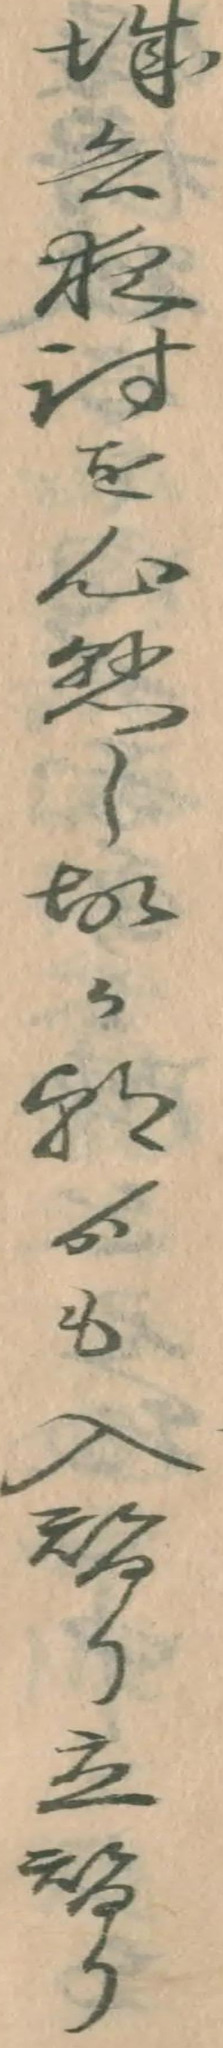城兵夜討を心懸し故か朝ゟも入替り立替り

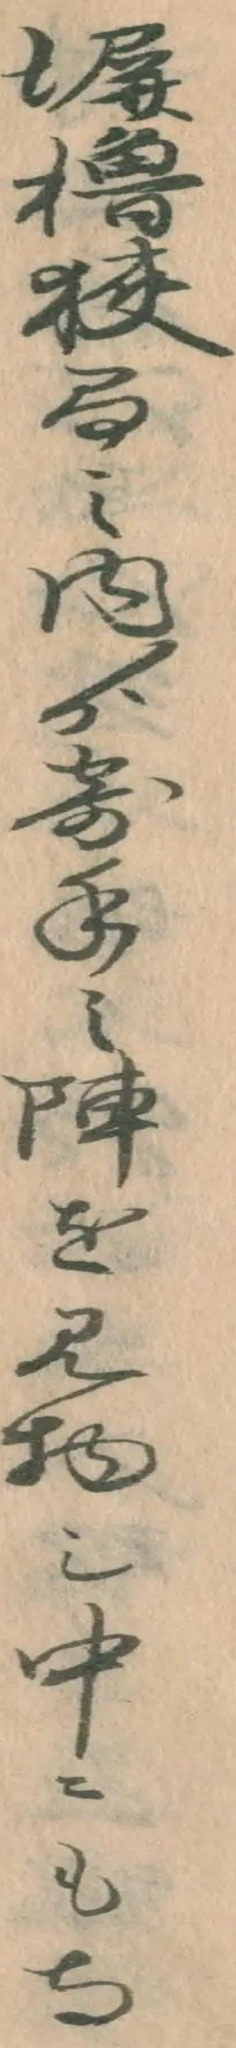塀櫓狭間之内ゟ寄手之陣を見物し中にも寺
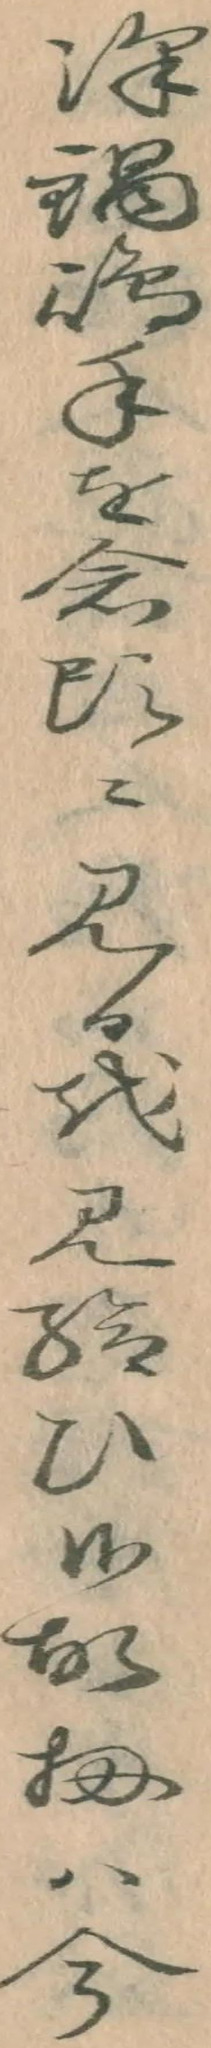沢鍋島手を念頭に見る越見給ひ候故扨は今
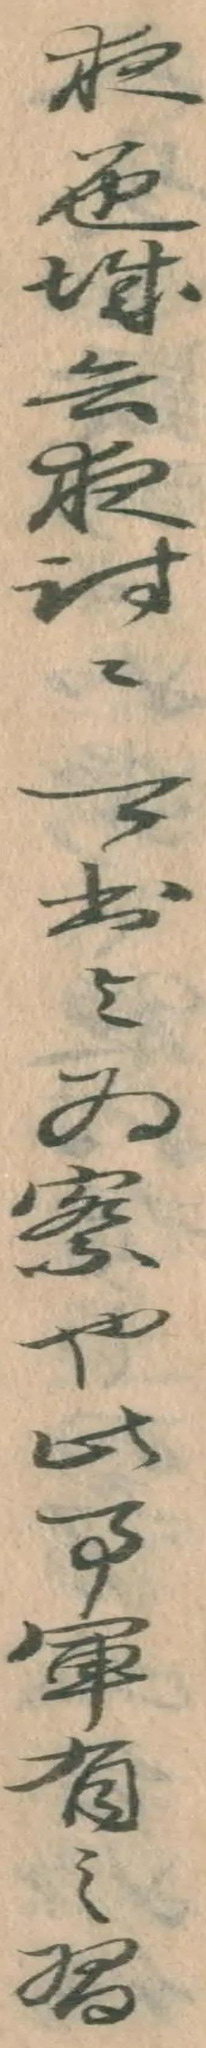夜辺城兵夜討に可出与ゐ察や此事軍有之習
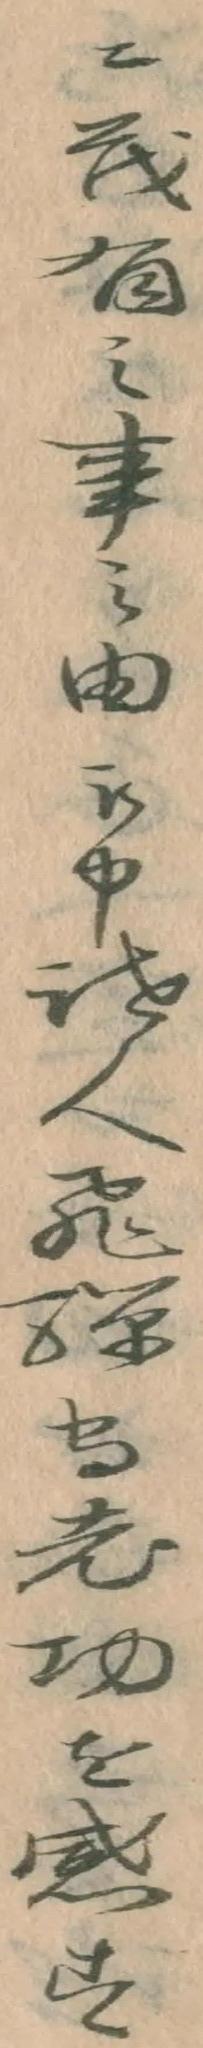に茂有之事之由被申諸人飛騨守老功を感春
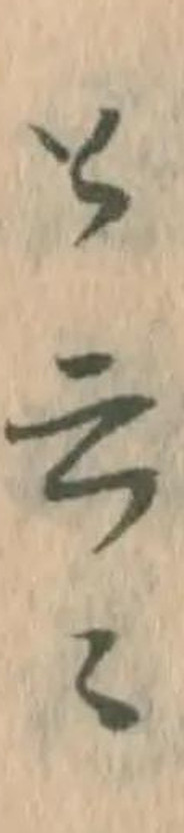と云々
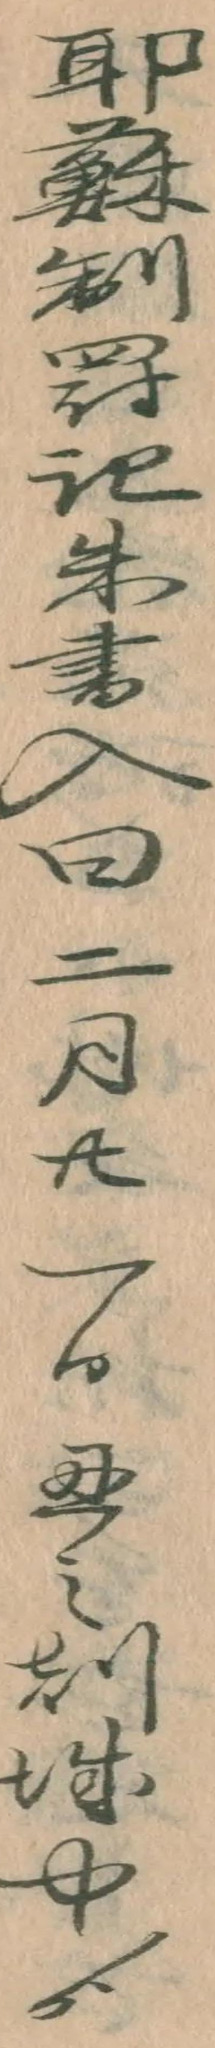耶蘇制罸記朱書入曰二月廿一日丑之刻城中ゟ
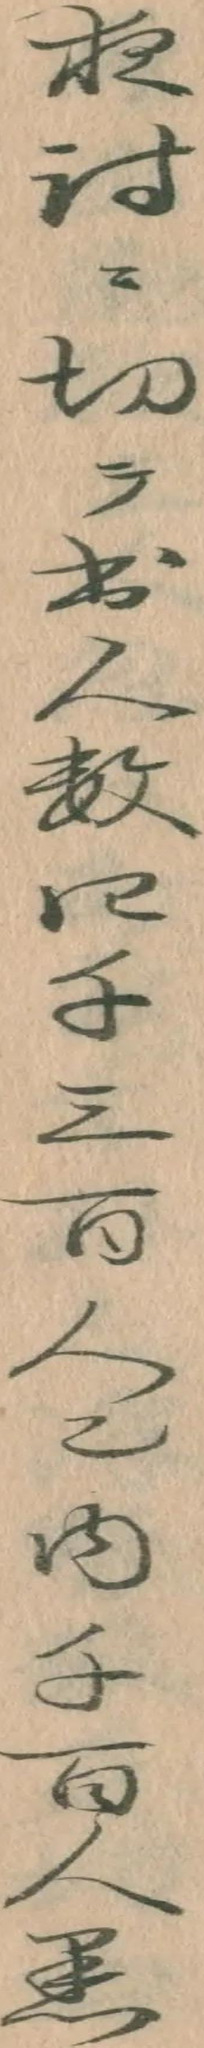夜討に切て出人数四千三百人也内千百人黒
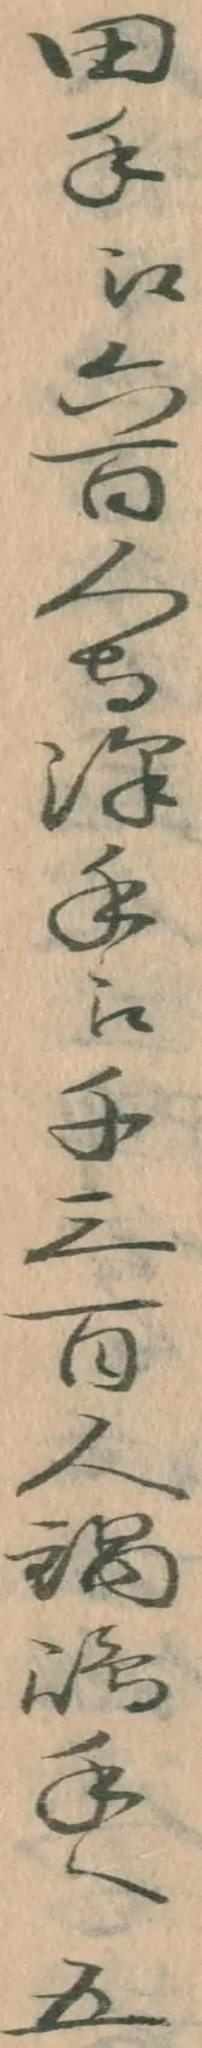田手江六百人寺沢手江千三百人鍋島手へ五
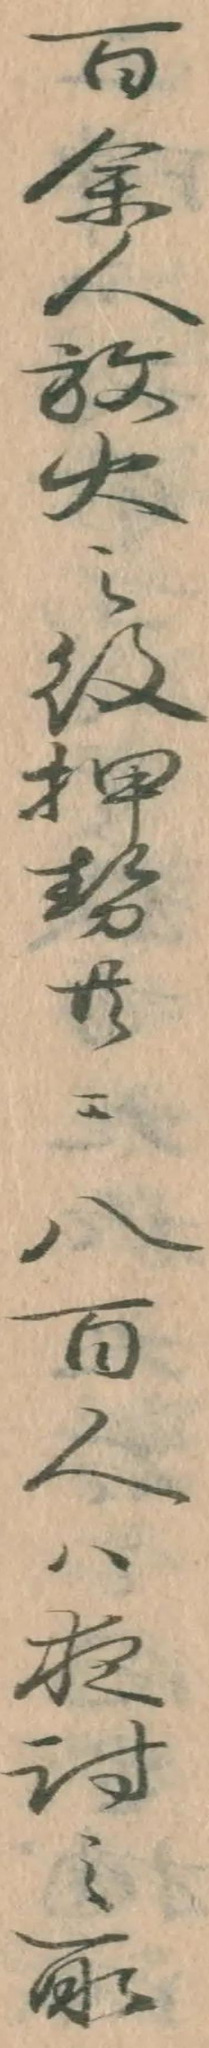百余人放火之役押勢共に八百人は夜討之取
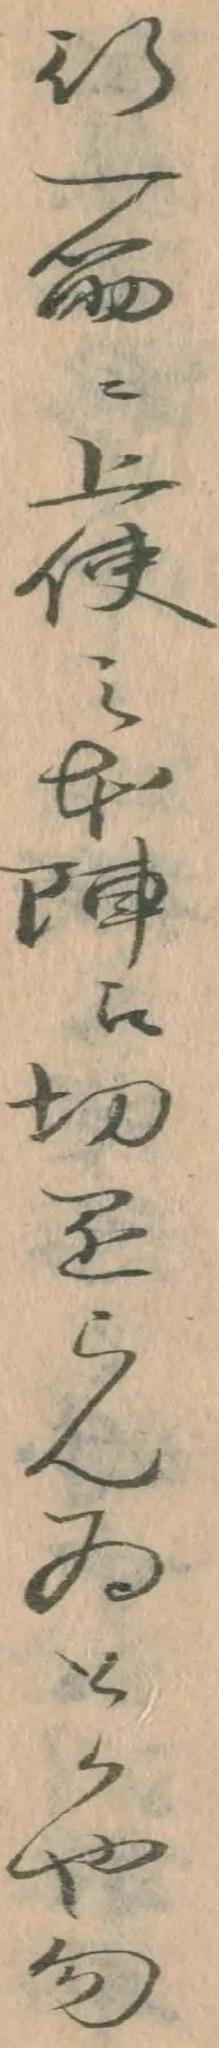行一筋に上使之本陣江切懸らんゐとかや勿
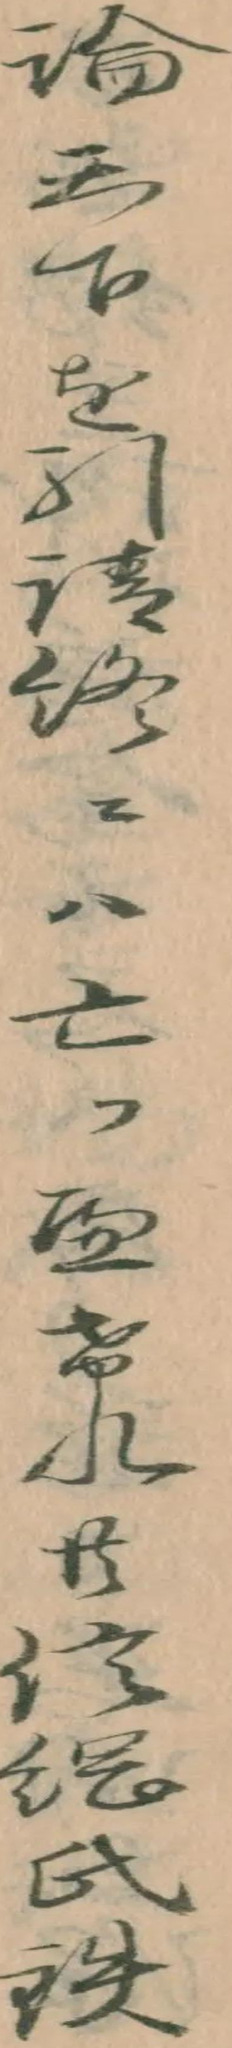論天下を引請終には亡く扁希れ共信綱氏鉄
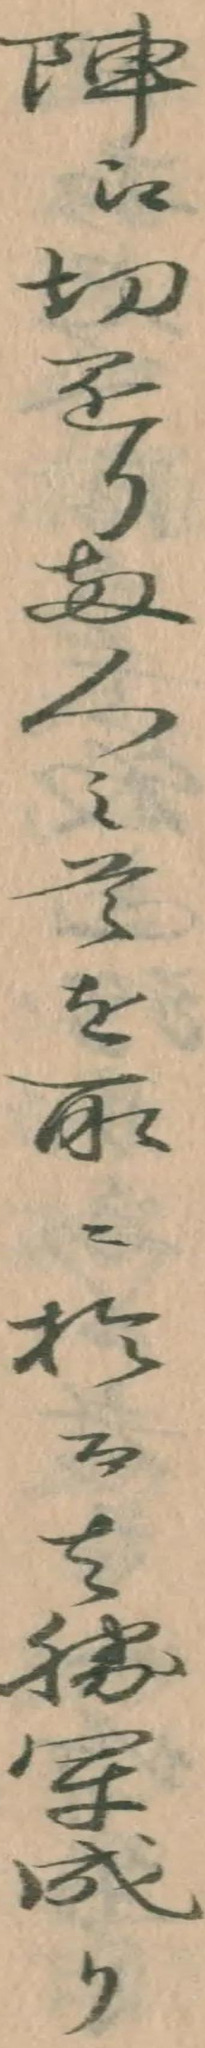陣江切懸り両人之首を取に於而者勝軍成り
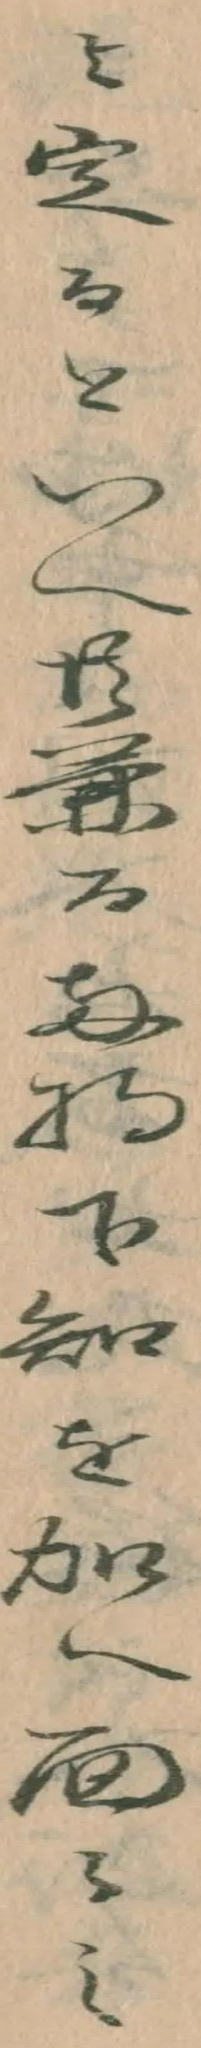与定るといへ共兼而両将下知を加へ面々之
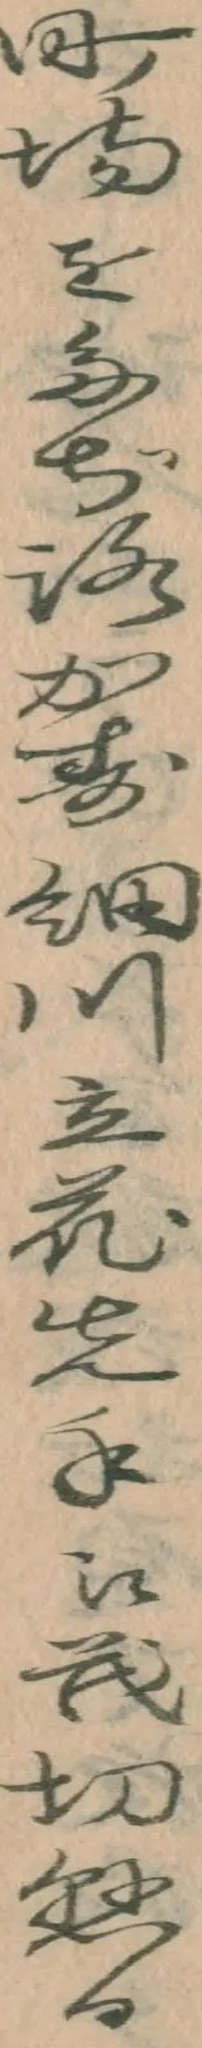町場を多ぢ路加寿細川立花先手江茂切懸る
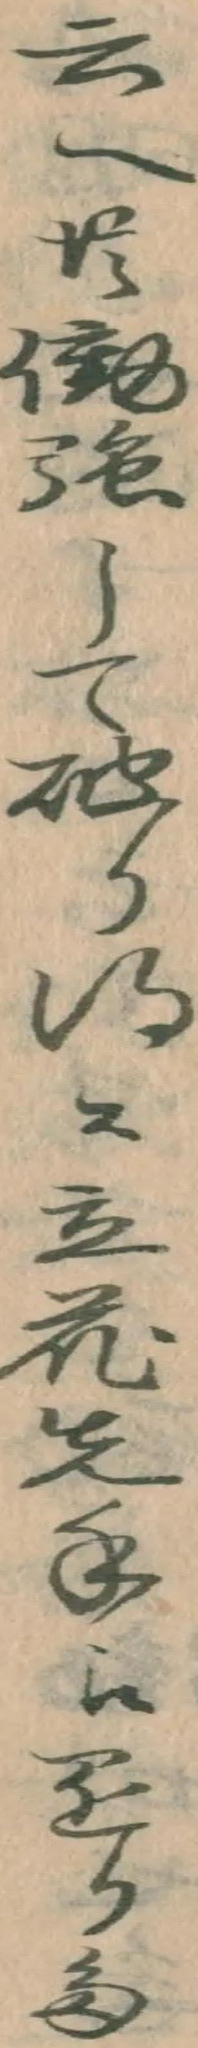云へ共働強して破り得す立花先手江懸り多
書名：切支丹御退治記 49巻. [7]
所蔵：国立国会図書館 National Diet Library, JAPAN
